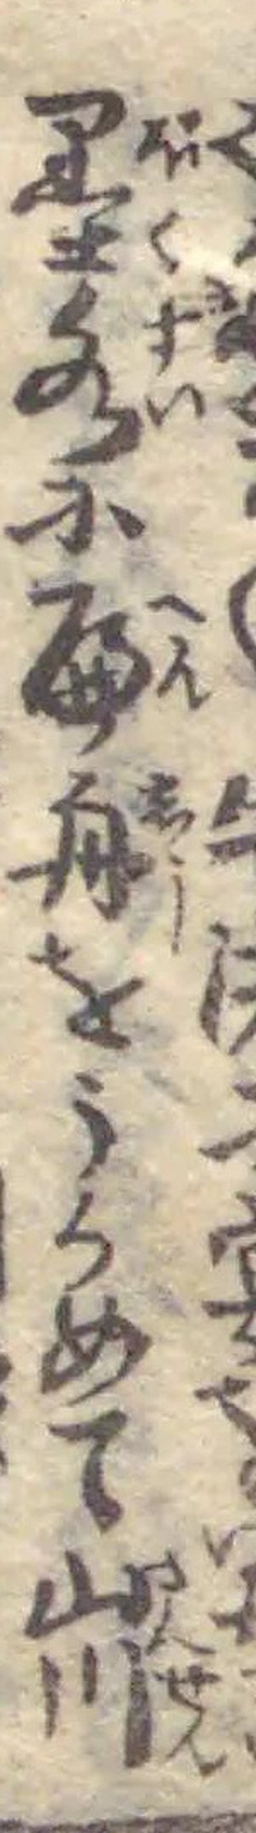墨水に扁舟をうかめて山川
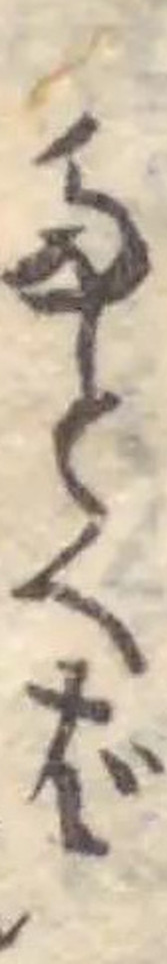たとへば
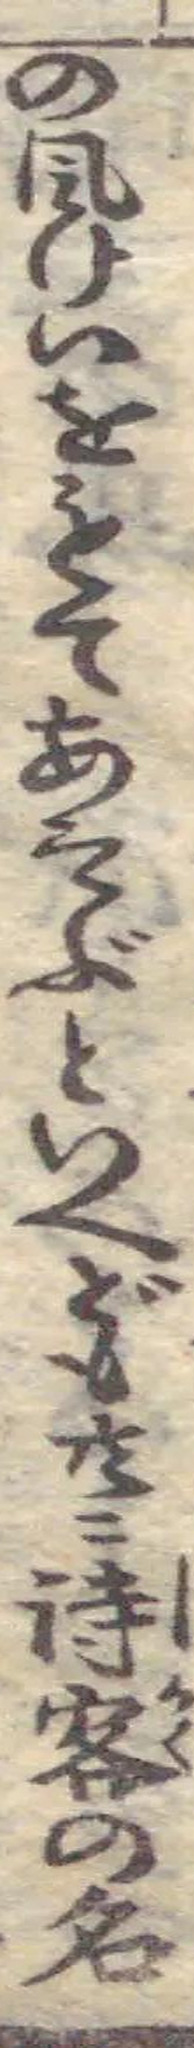の風けいをもてあそぶといへども共に詩客の名
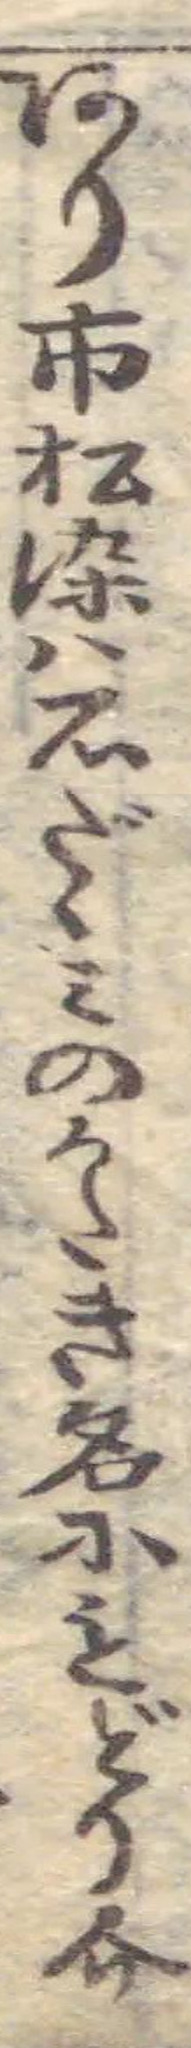あり市松染は石だゝみのかたき名にもどり介
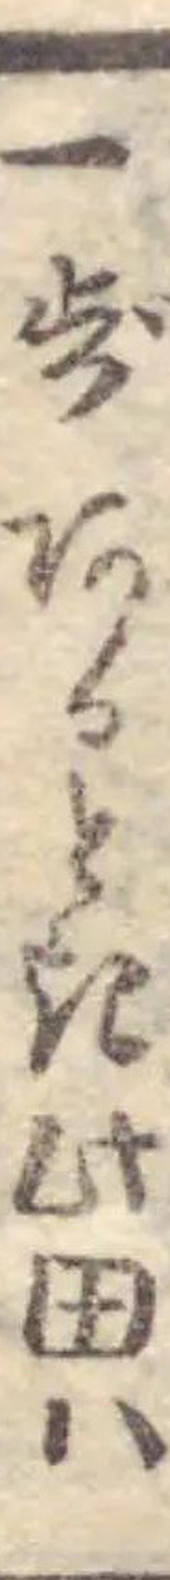一歩あるとき此田は
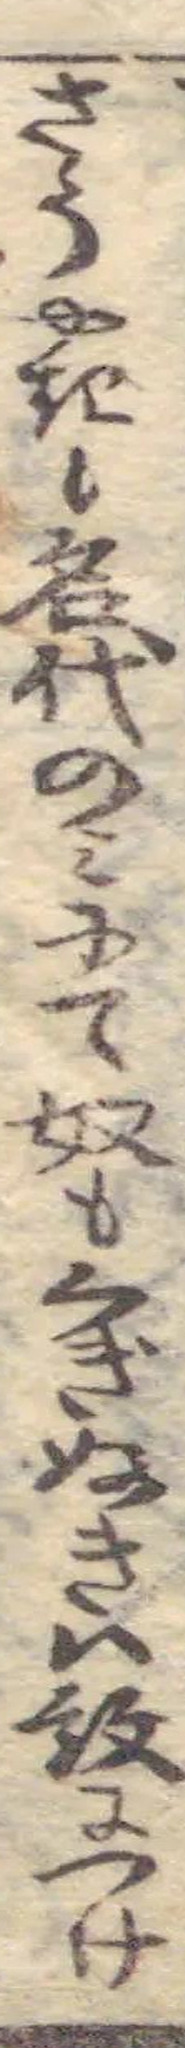さうやきも名代のみにて奴もくぎぬきは紋につけ
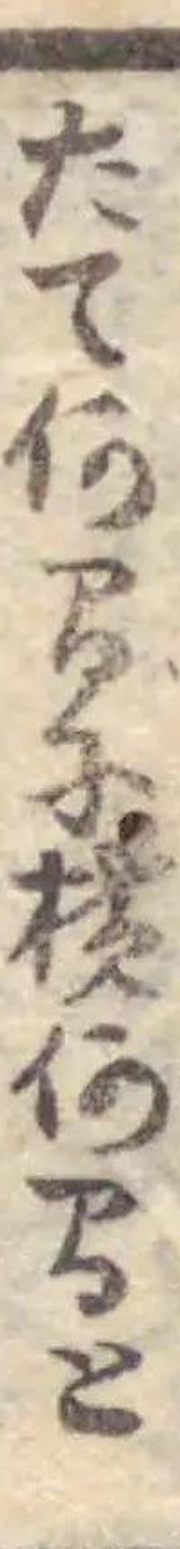たて何間横何間と
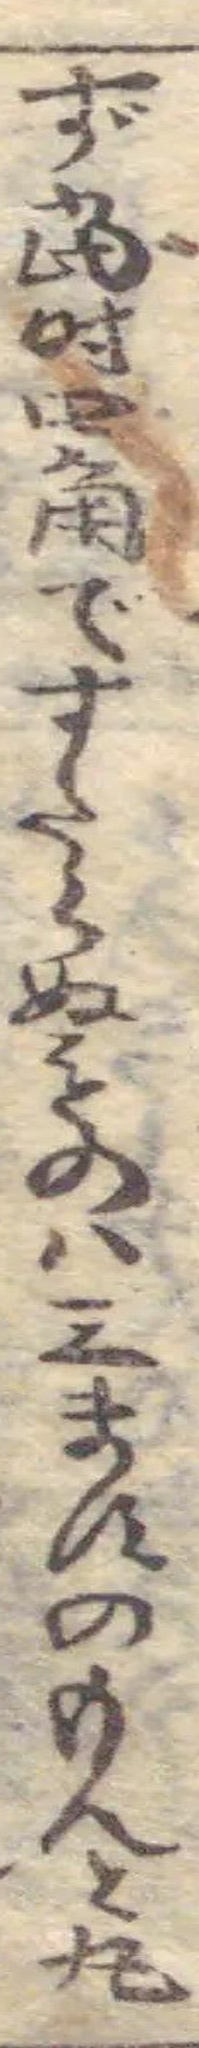ず当時四角ですたらぬものは三ますのもんと丸
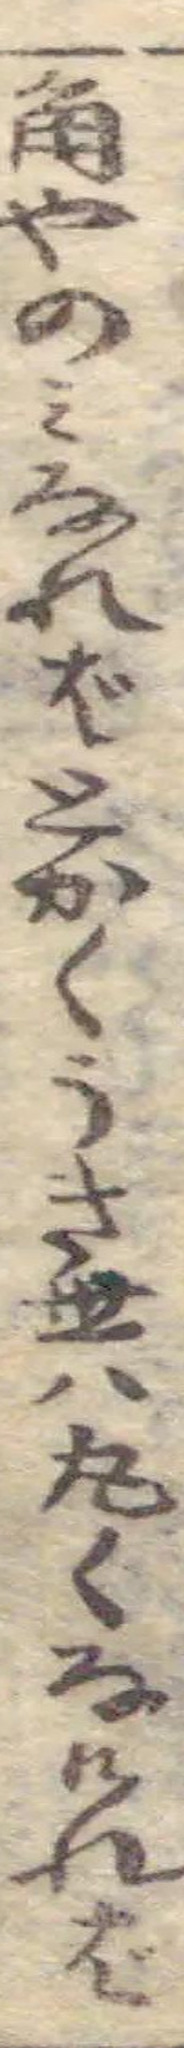角やのみなればとかくうき世は丸くなければ
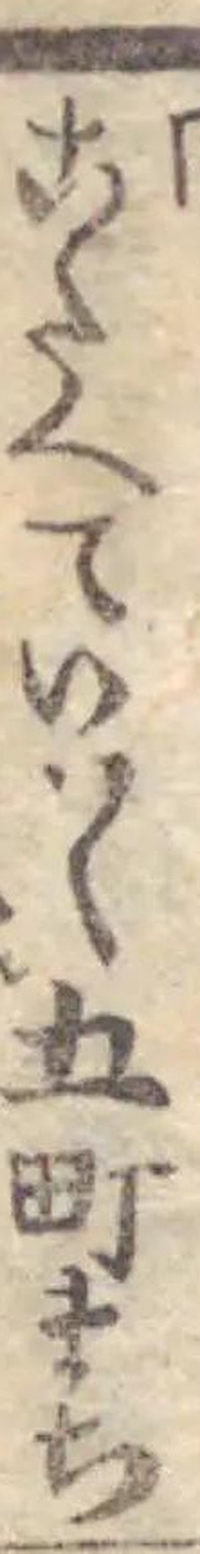こたへていはく五町まち
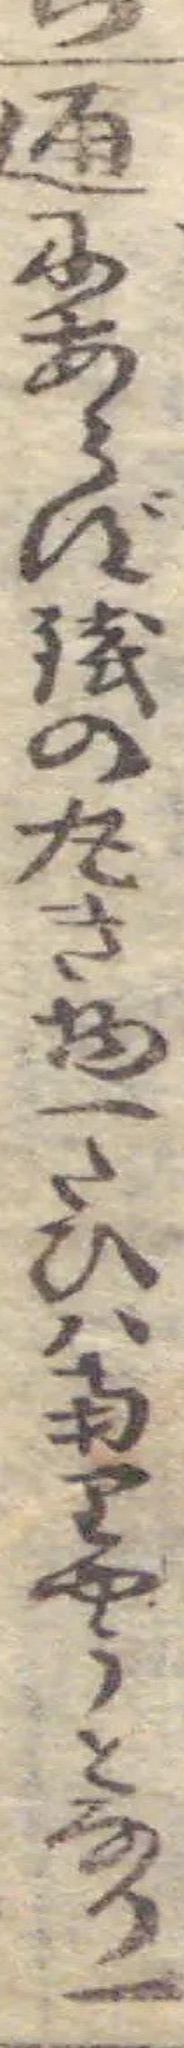通にあらず銭の丸き物一たひは当りうとなり一
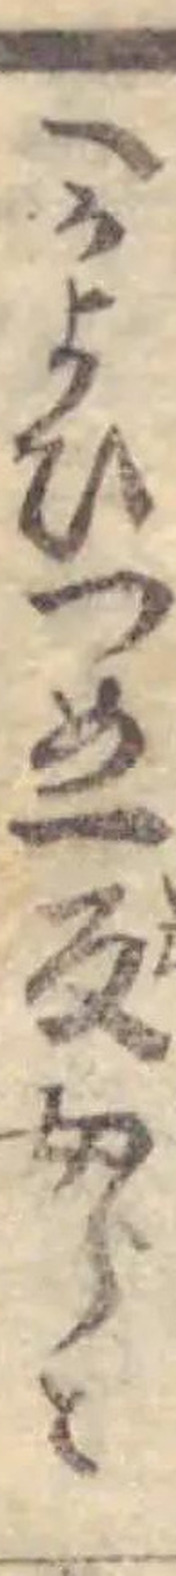へかよひつめ一反女郎と
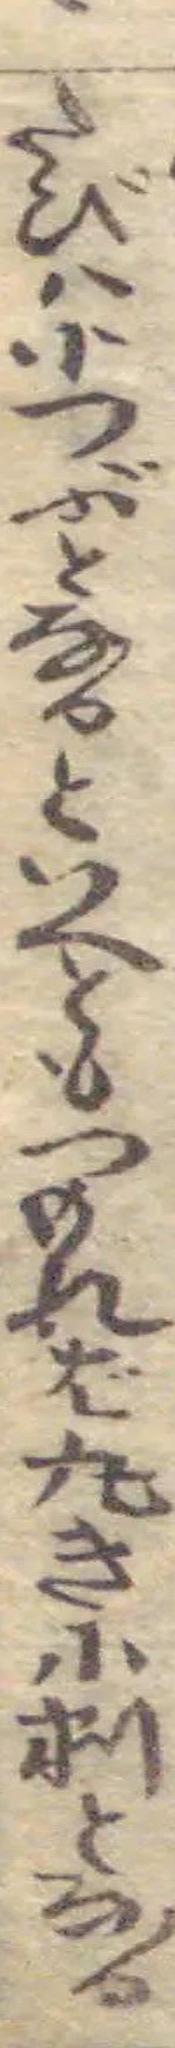たびは小つぶとなるといへともつもれば丸き小判となる

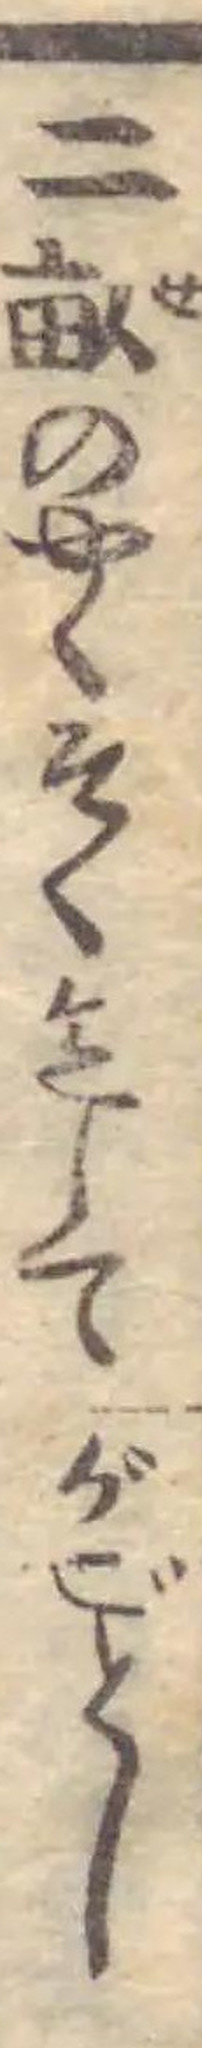二畝のやくそく迄して
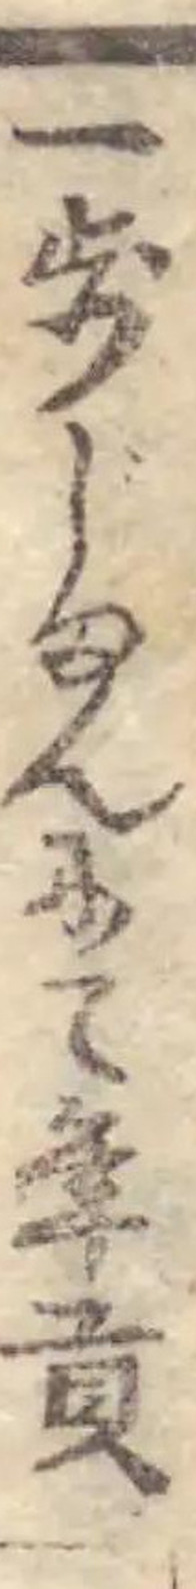一歩しまんにて年貢
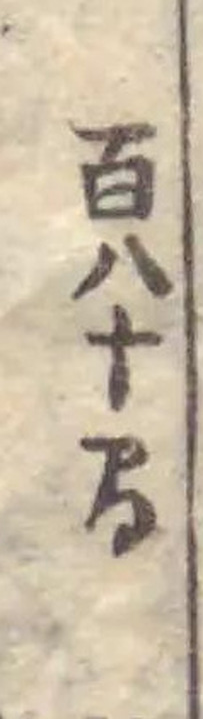百八十間
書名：大通人好記
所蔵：国立国会図書館 National Diet Library, JAPAN
